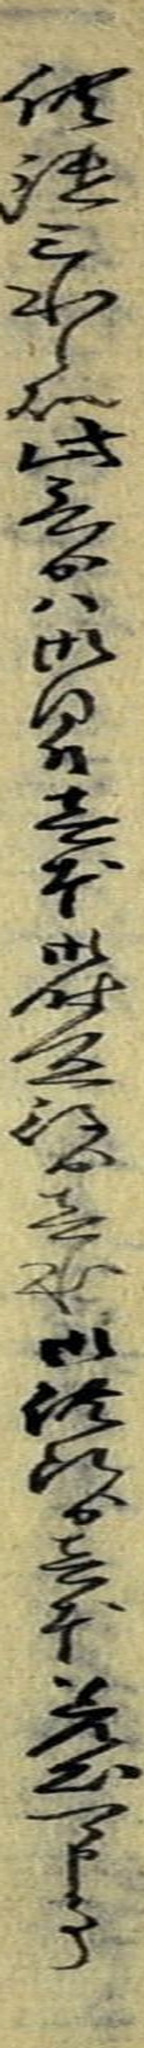供鑓三本之処此度ゟハ御目付壱本御時宜役ゟ壱本御供頭ゟ壱本差出可申事
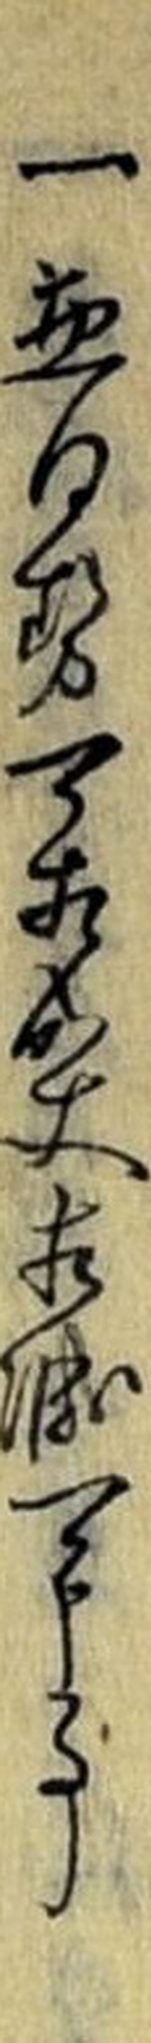一惣同勢可相成丈相減可申事
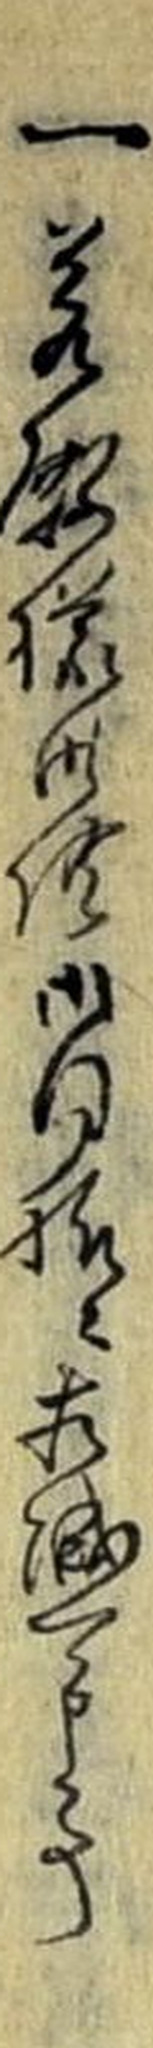一若殿様御供御同様ニ相減可申事
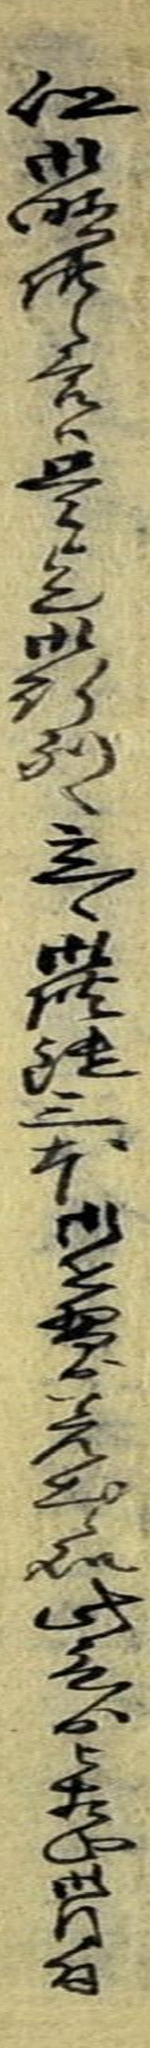但御略供之節ハ只今迄御行列へ立候御供鑓三本御近習ゟ差出候処此度ゟ被相止御目付
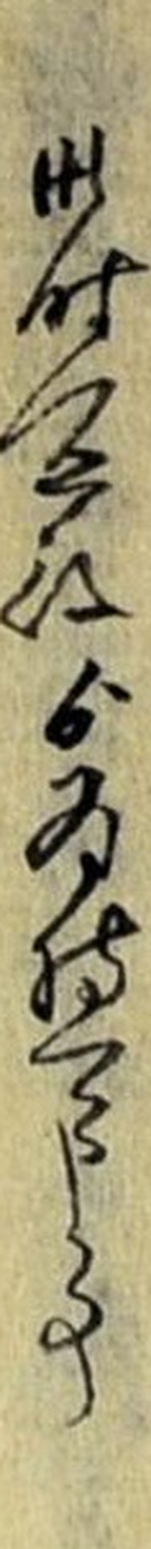御時宜役ゟ為持可申事
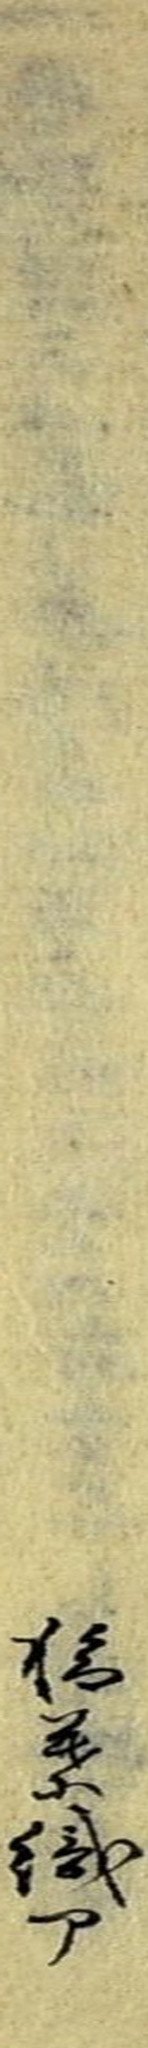稲葉織部
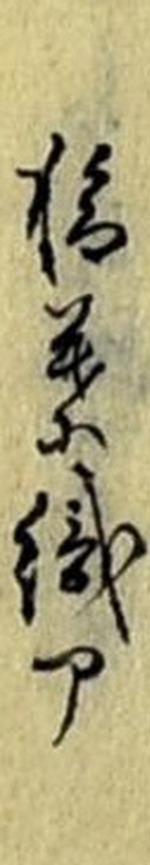稲葉織部
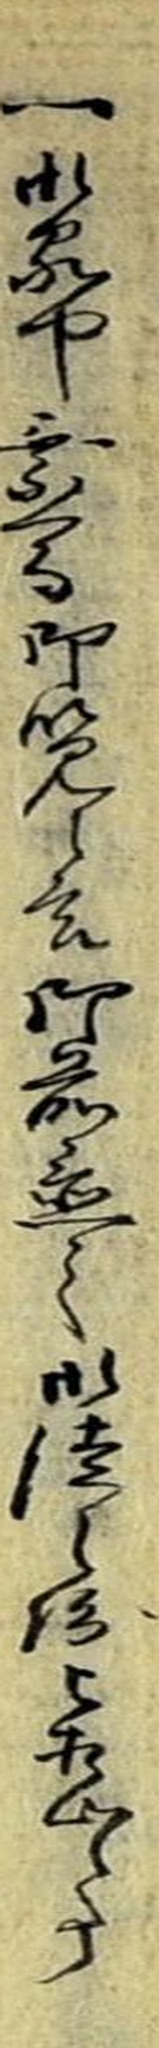一御家中乗馬御覧之節御前置之御徒之儀被相止候事
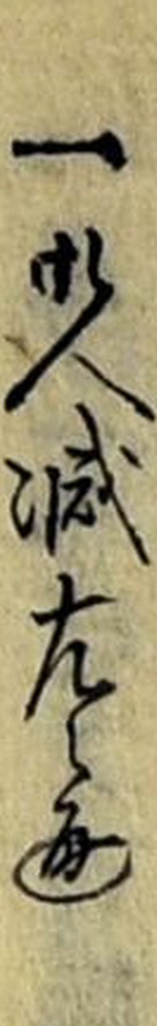一御人減左之通
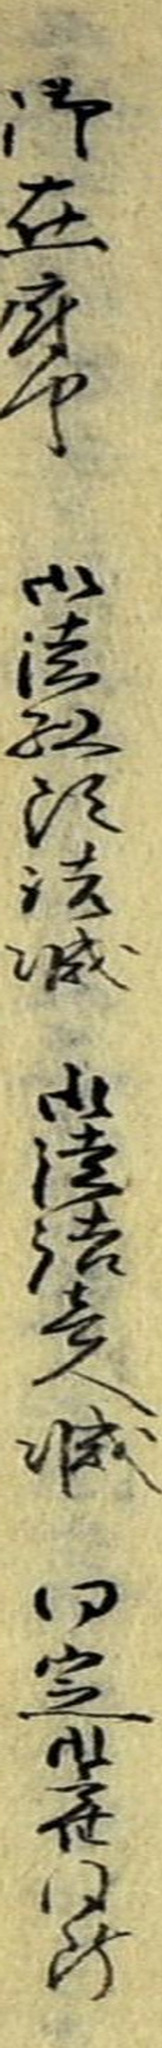御在府中御徒組頭詰減御徒詰壱人減同定御雇同断

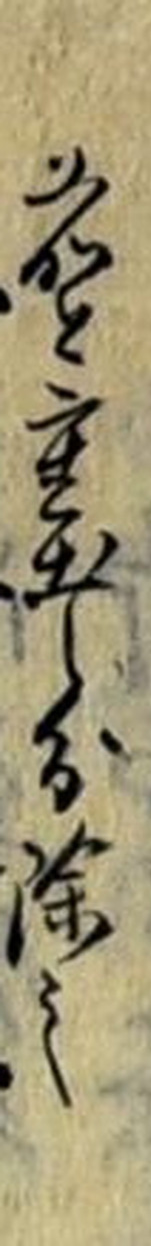前と重出之分除之
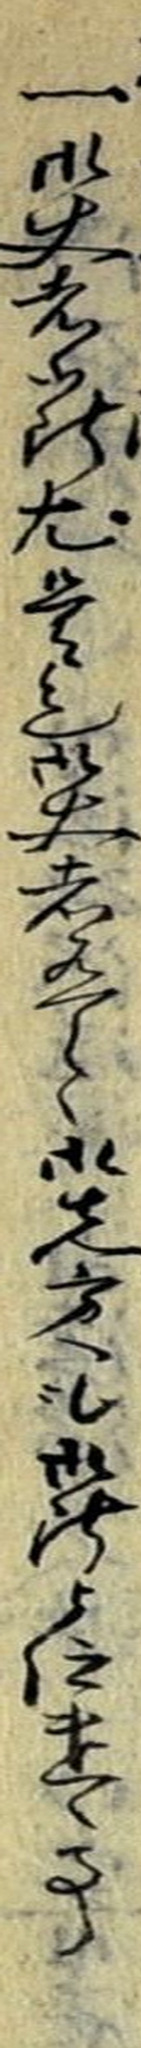一御使者御断尤是迄御使者有之候御先方へも御断被仰遣候事
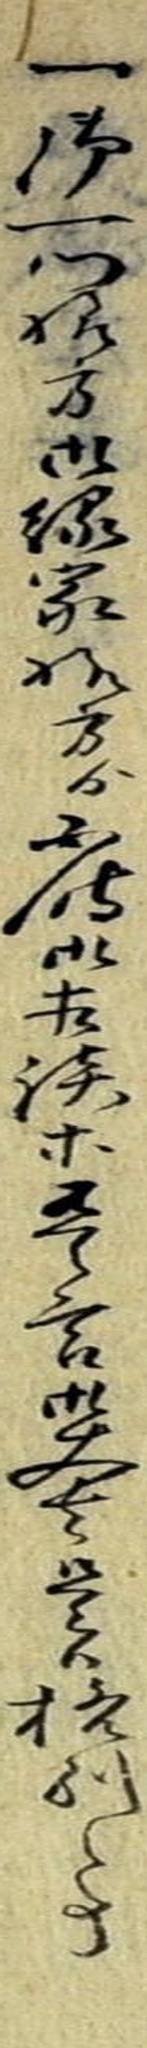一御一門様方御縁家様方ゟ不時御相談等有之節御使者是ハ格別之事
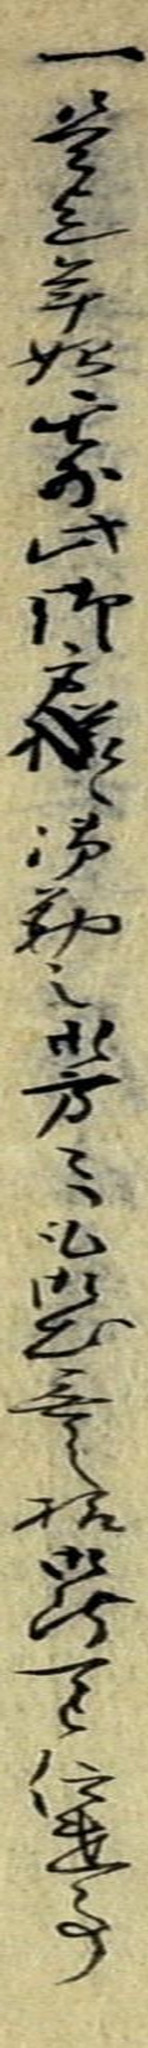一是迄年始其外此御方様へ御勤之御方々へも御出無之様御断可被仰遣事
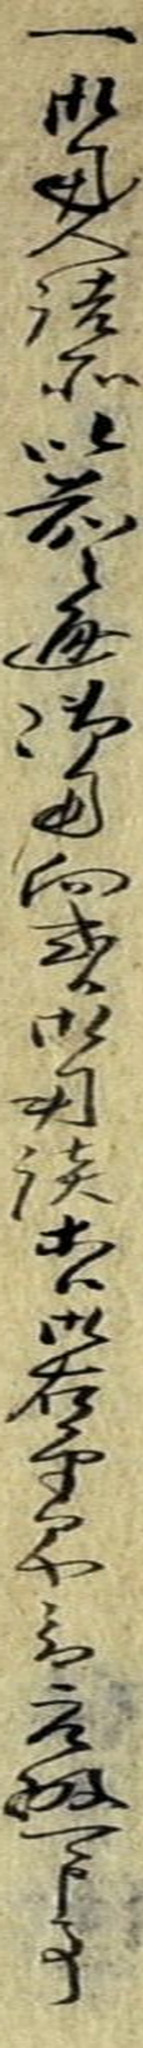一御用人諸所以前之通御用向或ハ御用談等ハ御右筆部屋ニ而取扱可申事
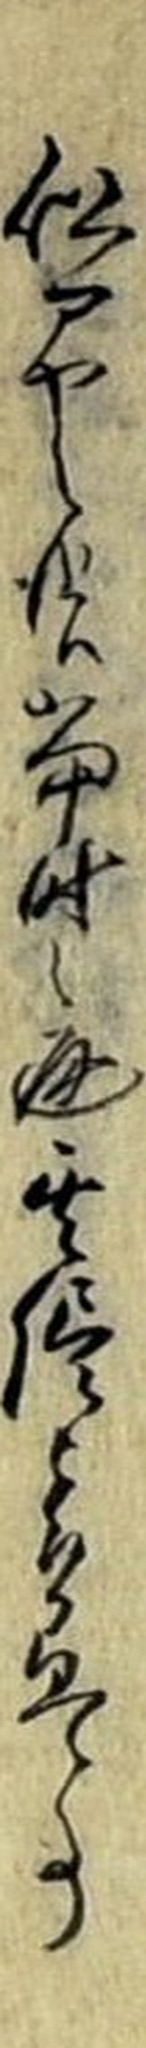但部屋之儀ハ当時之通其儘被下置候事
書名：命令之部 三
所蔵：福井県文書館 Fukui Prefectural Archives
